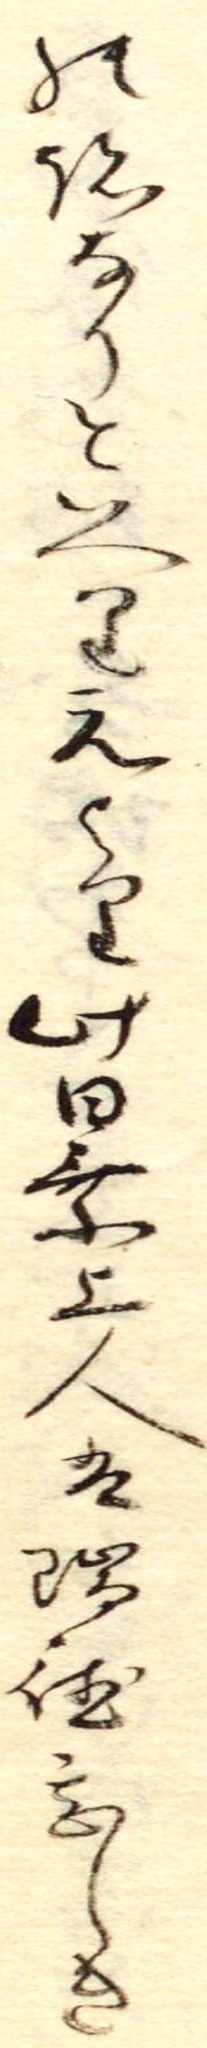の跡なりといへり元より此日乗上人は瑞徳甚しき
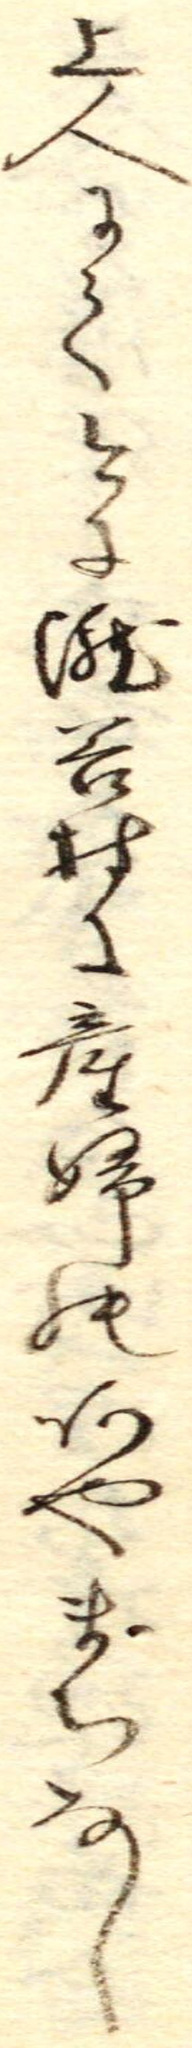上人にて今に瀧谷村に産婦のあやまちなし
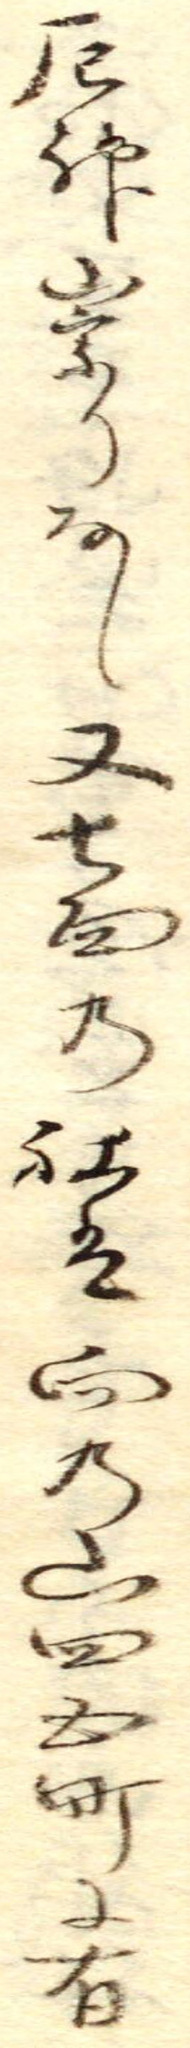厄神祟りなし又七面の社は向の山四五町に有
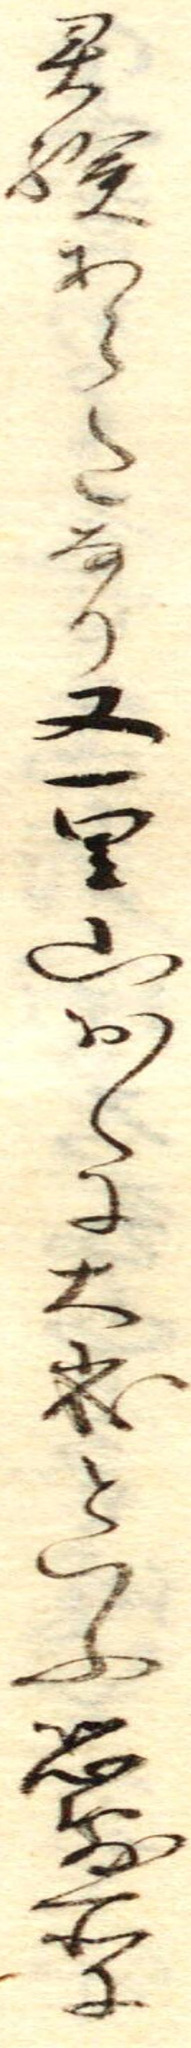霊験あらたなり又一里山おくに大森といふ恐敷所に

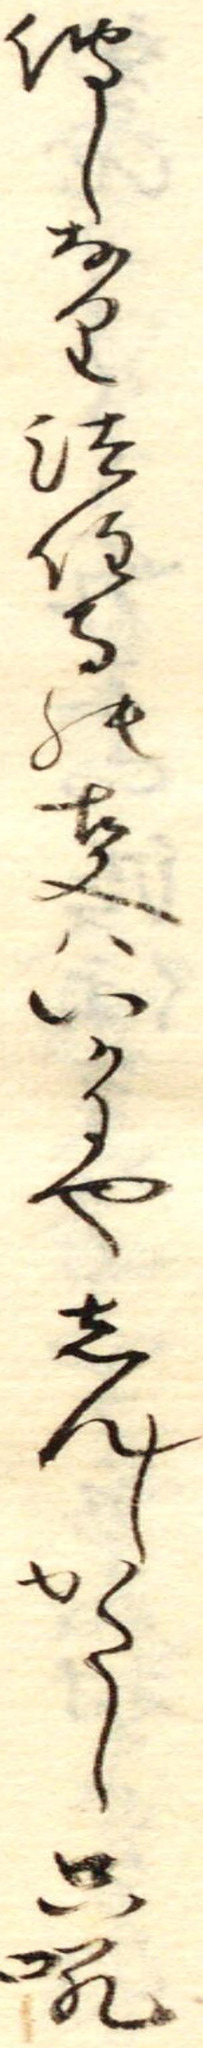伝しなり法住寺の事はいかにやしんしかたし只吼
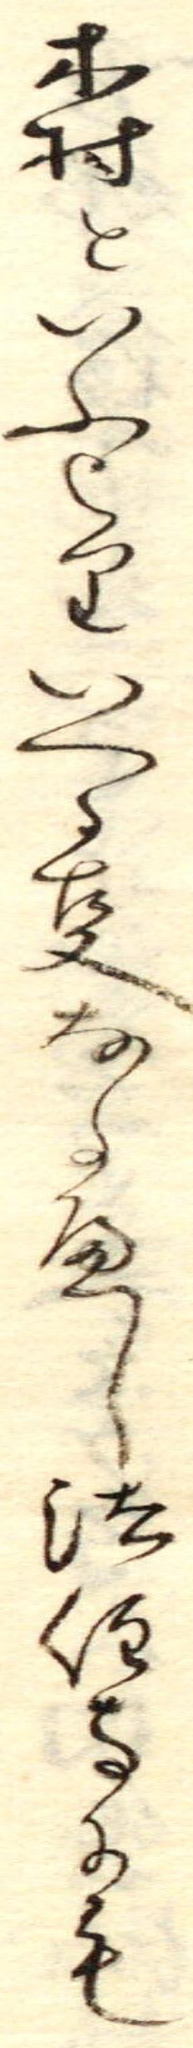木村といふよりいつる事なるへし法住寺にも
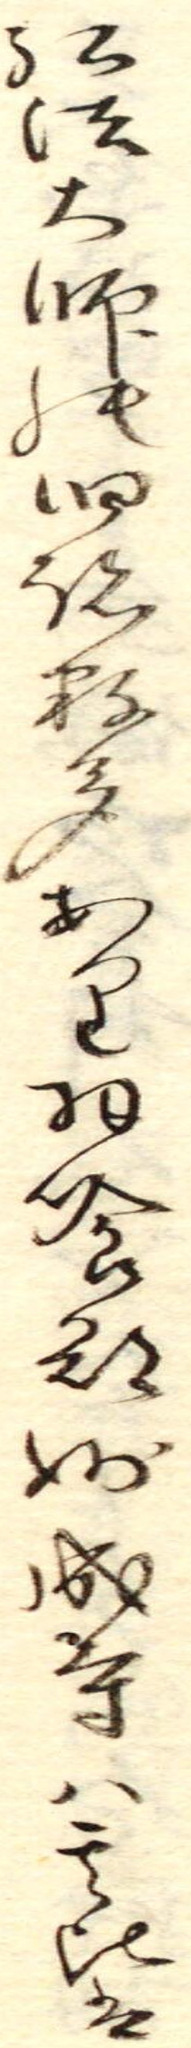弘法大師の旧跡数多あり羽喰郡妙成寺は其比は
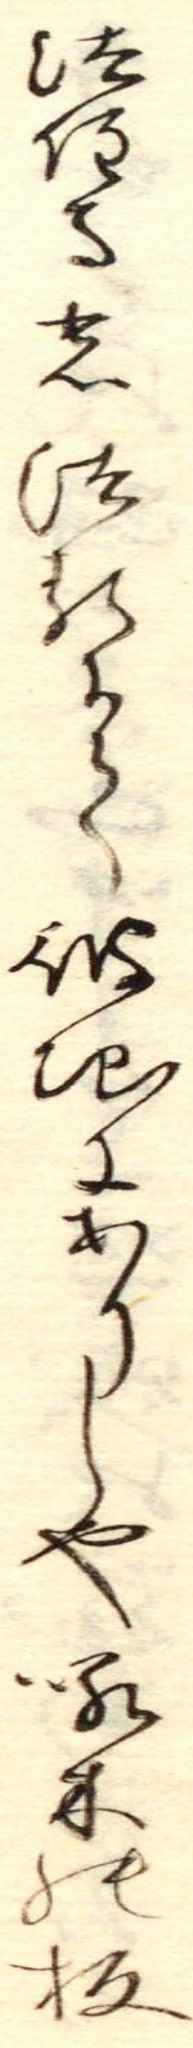法住寺の法類にて彼地にありしや吼木の板
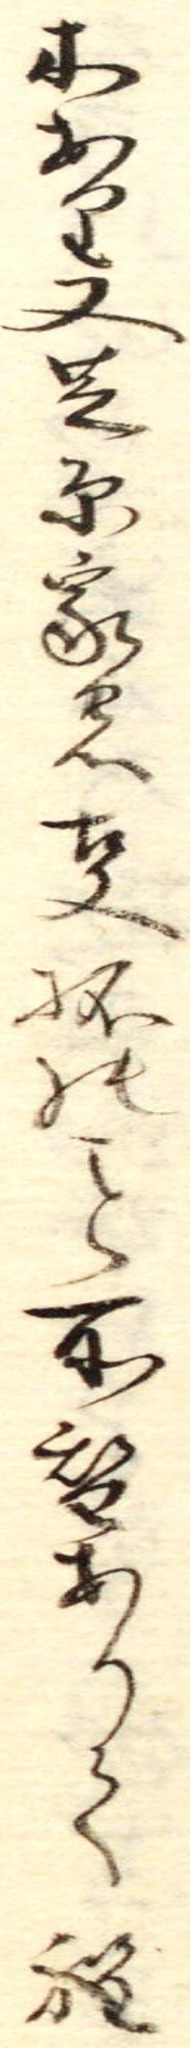木あり又芝原家の事抔のこと所替ありて程
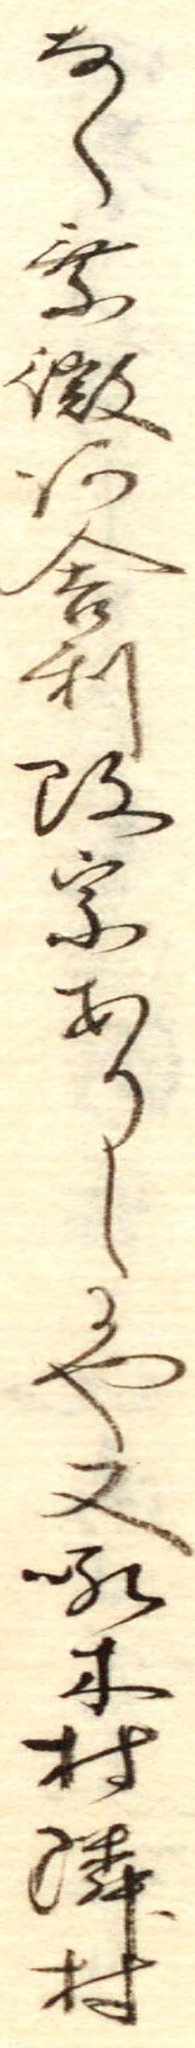なく乗徴阿舎利改宗ありしにや又吼木村隣村
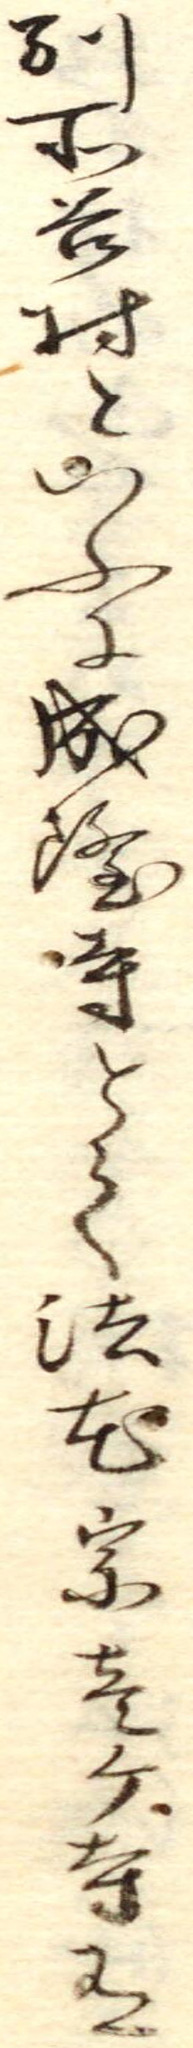別所谷村といふに成隆寺とて法花宗壱ヶ寺有
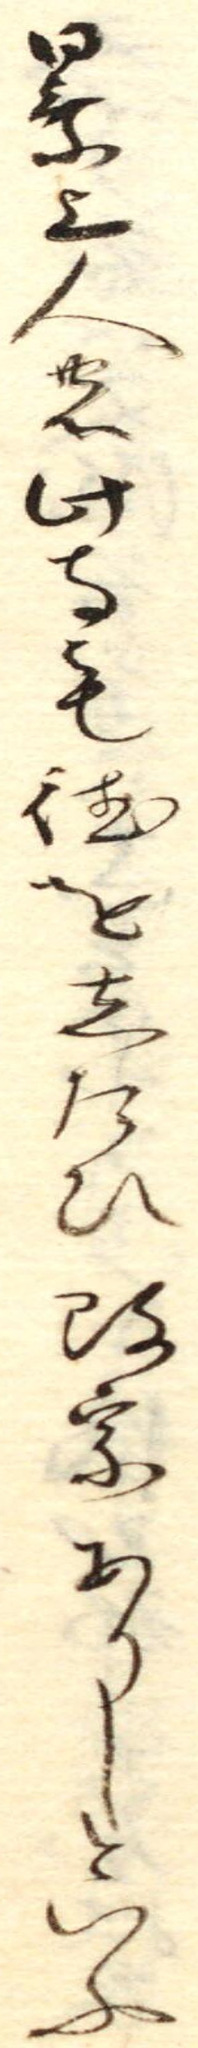日乗上人の此寺も徳をしたひ改宗ありしといふ
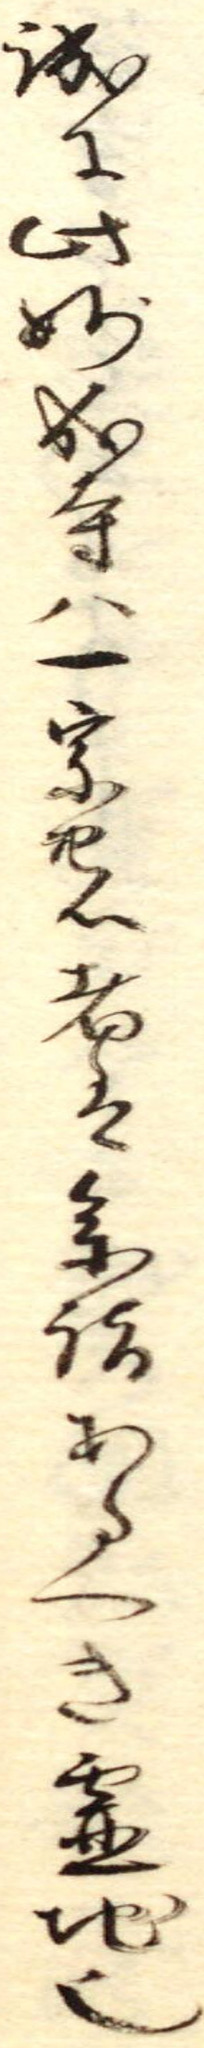誠に此妙成寺は一宗の者は参詣あるへき霊地也
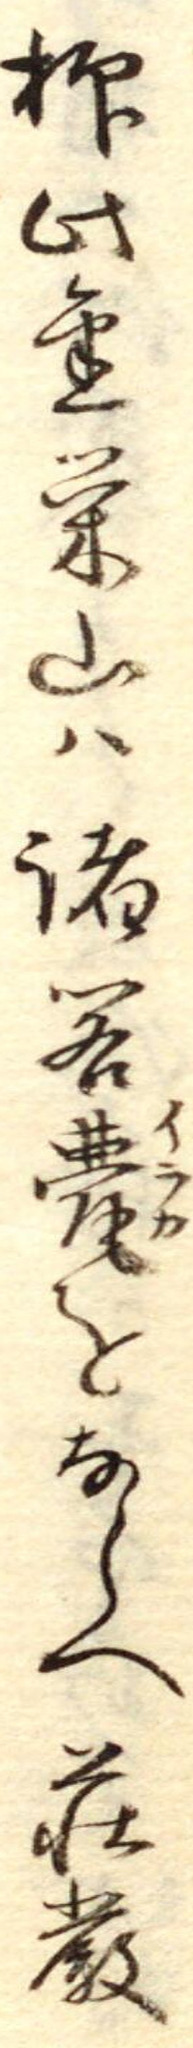抑此金栄山は諸閣甍をならへ荘厳
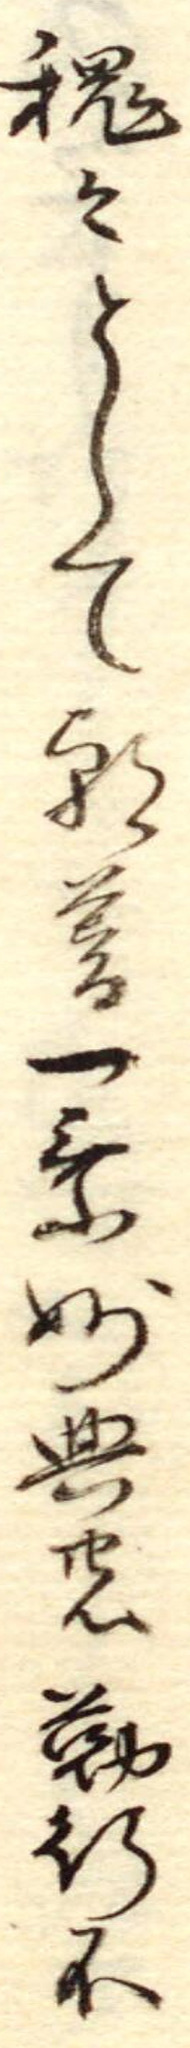槐々として朝暮一乗妙典勤行不
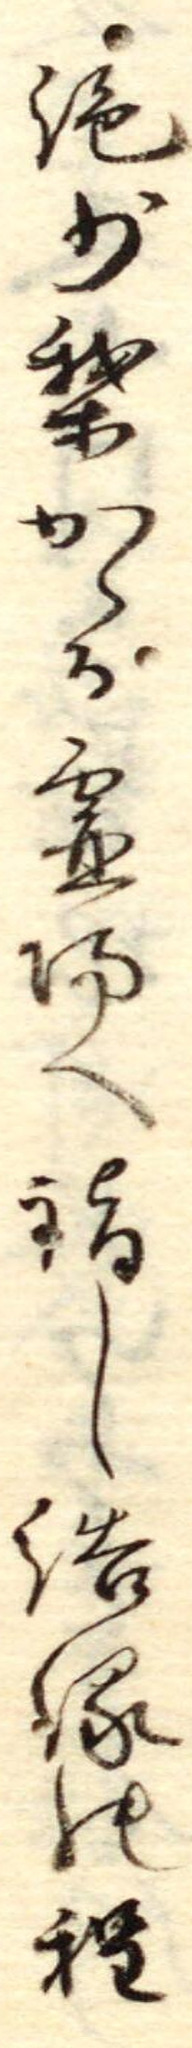絶少我等かゝる霊場へ詣し結縁の程
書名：能登名跡誌
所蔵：Ishikawa Prefectural Library
